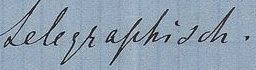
telegraphisch.
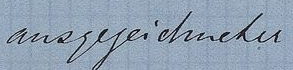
ausgezeichneter
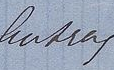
Hochschätzung
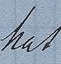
Bern
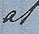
31.
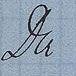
1869.
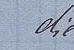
Der
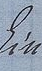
hat
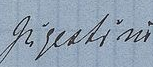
zugestimmt
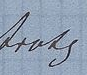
Sept. )
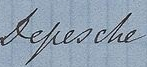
Depesche
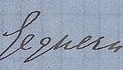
trotz ihrer
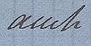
Reserven
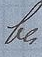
den
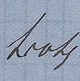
Sache
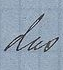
vor-
